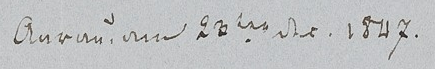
Aarau, am 23ten Dec. 1847.
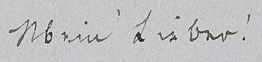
Mein Lieber!
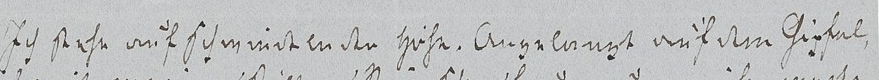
Ich stehe auf schwindelnder Höhe. Angelangt auf dem Gipfel,
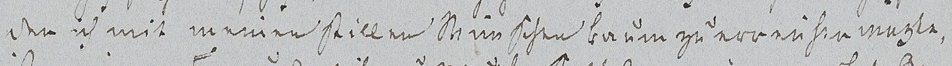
den ich mit meinen stillen Wünschen kaum zu erreichen wagte,
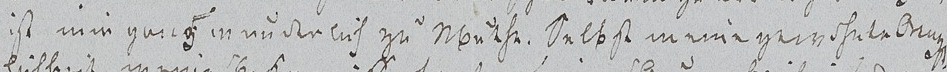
ist mir ganz wunderlich zu Muthe. Selbst meine gewohnte Aengst-
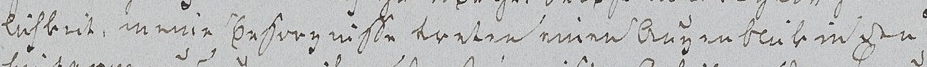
lichkeit, meine Besorgnisse treten einen Augenblick in den
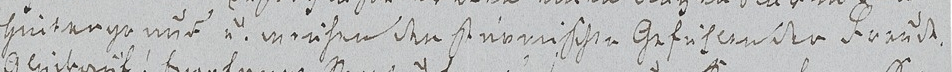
Hintergrund u. weichen den stürmischen Gefühlen der Freude.
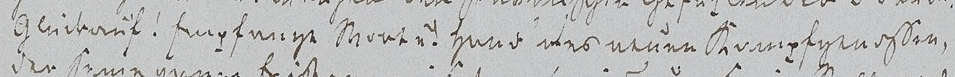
Glückauf! Empfange Wort u. Hand des neuen Kampfgenossen,
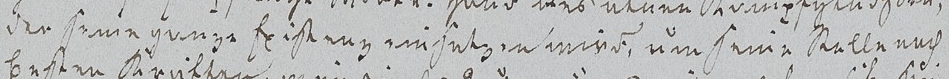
der seine ganze Existenz einsetzen wird, um seine Stelle nach
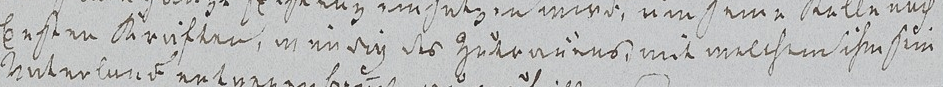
besten Kräften, würdig des Zutrauens, mit welchem ihm sein
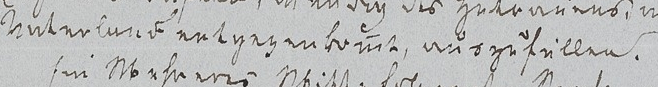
Vaterland entgegenkommt, auszufüllen.
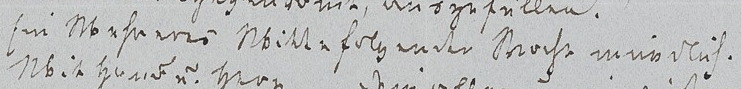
Ein Mehreres Mitte folgender Woche mündlich.
